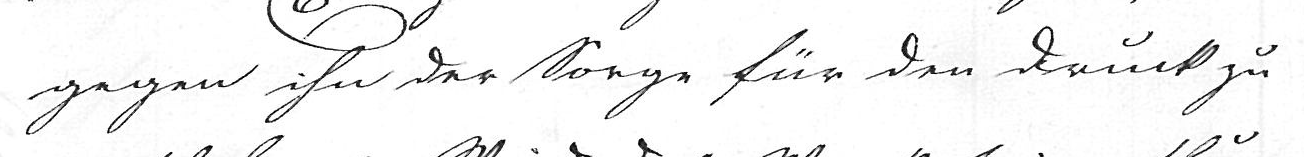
gegen ihn der Sorge für den Druck zu
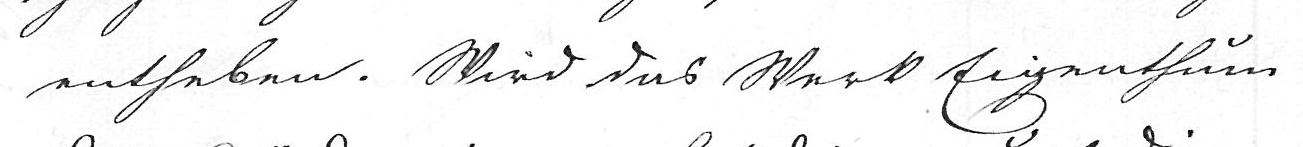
entheben. Wird das Werk Eigenthum
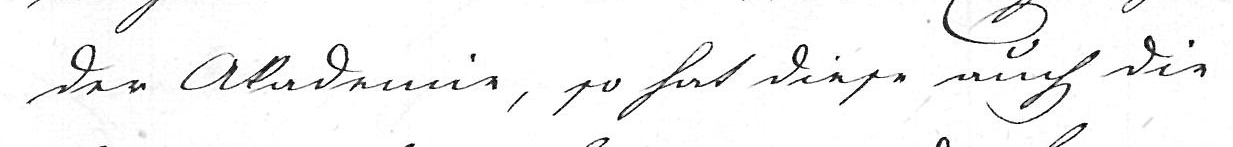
der Akademie, so hat diese auch die
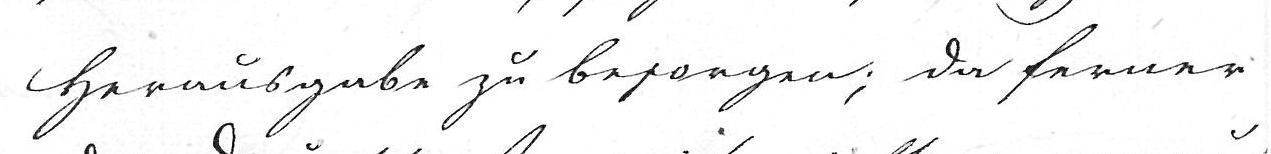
Herausgabe zu besorgen; da ferner
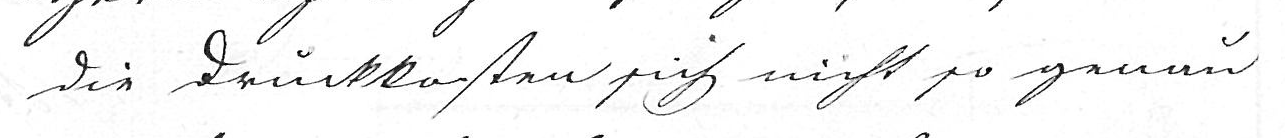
die Druckkosten sich nicht so genau
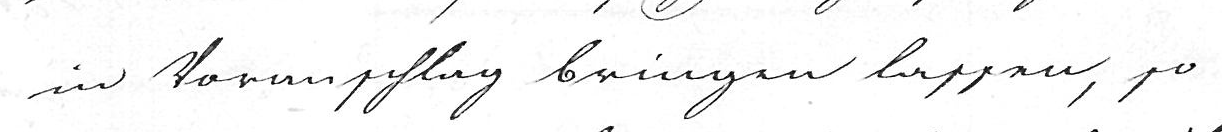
in Voranschlag bringen lassen, so
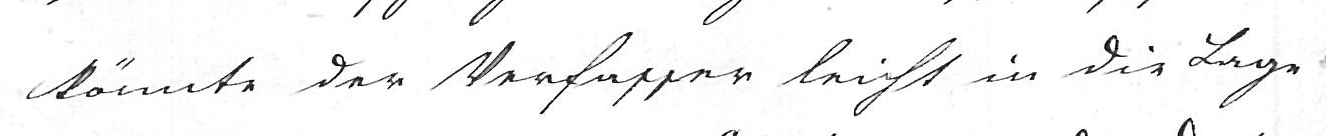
könnte der Verfasser leicht in die Lage
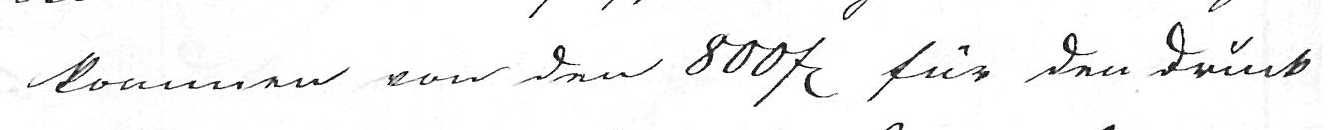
kommen von den 800 fl für den Druck
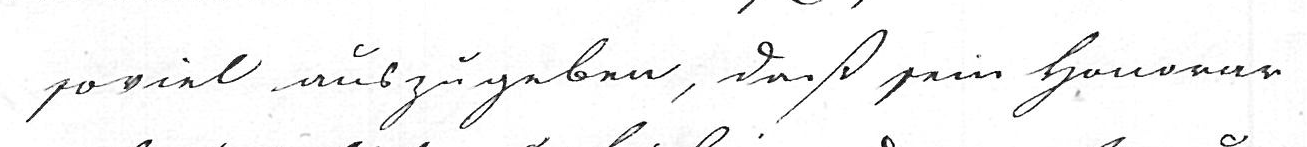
soviel auszugeben, daß sein Honorar
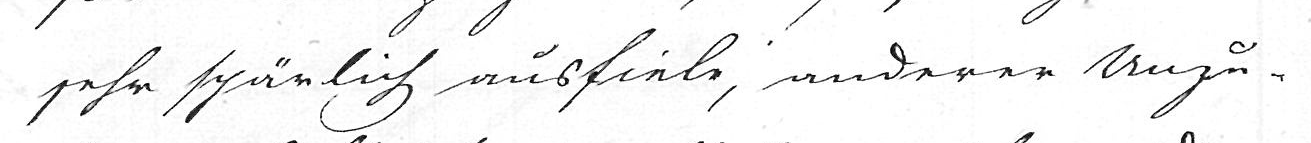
sehr spärlich ausfiele, anderer Unzu-
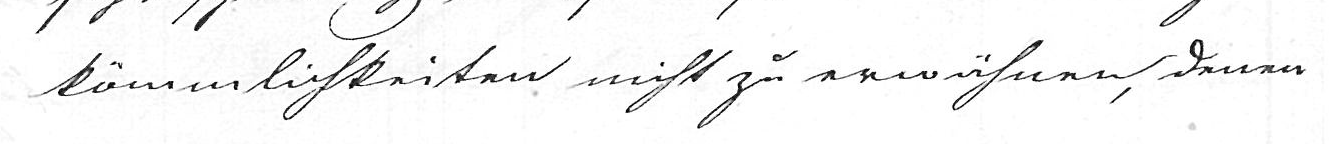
kömmlichkeiten nicht zu erwähnen, denen
